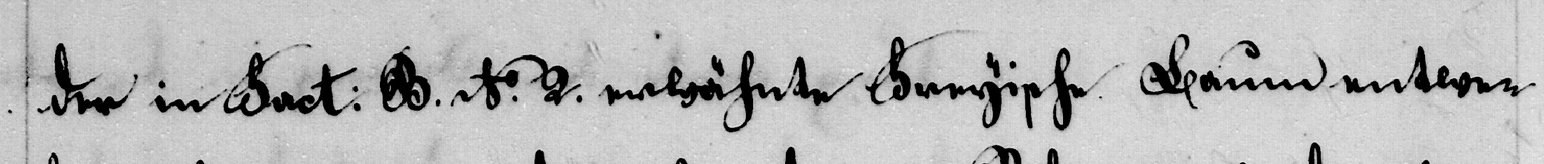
der Fact: B. No. 2.erwähnte Freyische Baum entwe¬
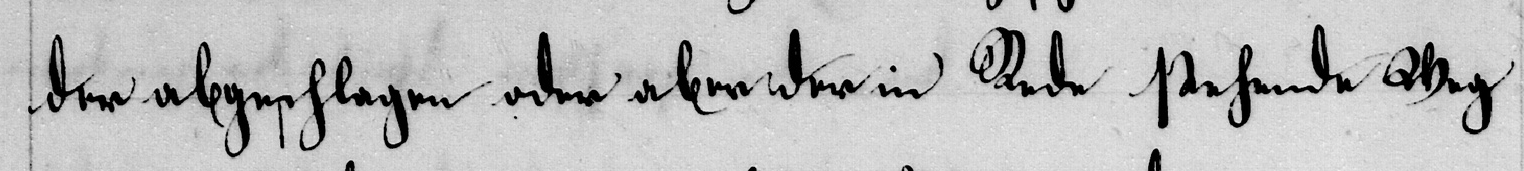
der abgeschlagen oder aber der in Rede stehende Weg
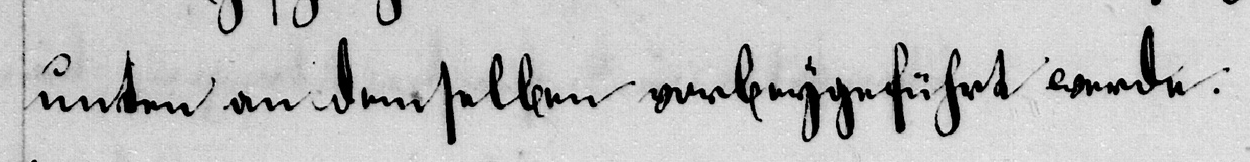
unten an demselben vorbeygeführt werde:
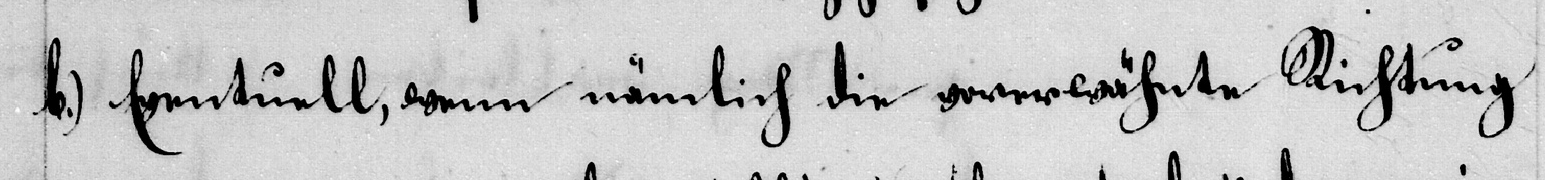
b.) Eventuell, wenn nämlich die vorerwähnte Richtung
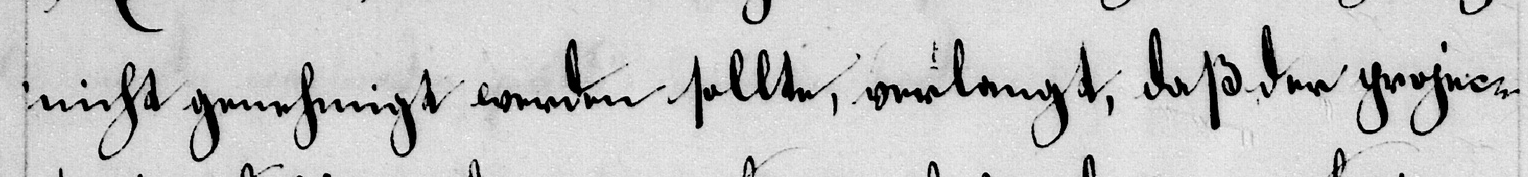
nicht genehmigt werden sollte, verlangt, daß der projec¬
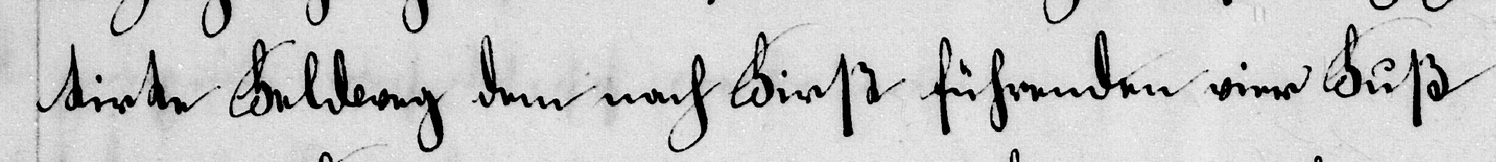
tirte Feldweg dem nach First führenden vier Fuß
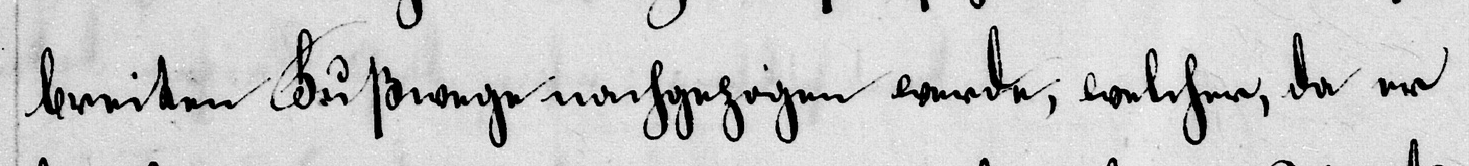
breiten Fußwege nachgezogen werde, welcher, da er
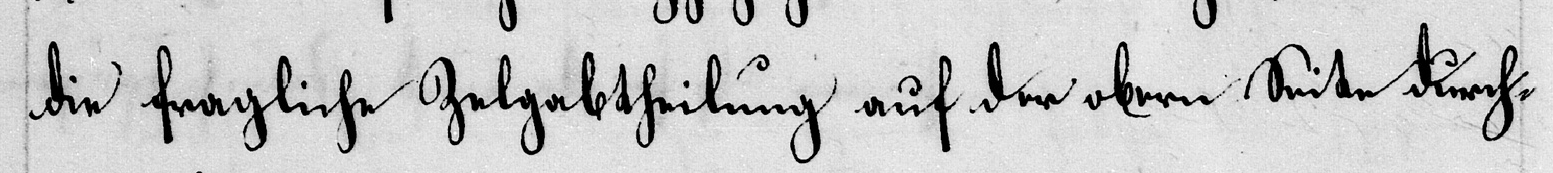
die fragliche Zelgabtheilung auf der obern Seite durch¬
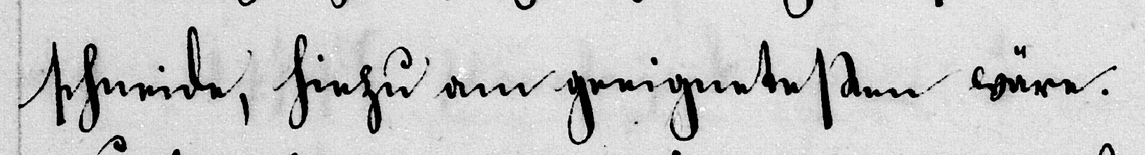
schneide, hiezu am geeignetesten wäre.
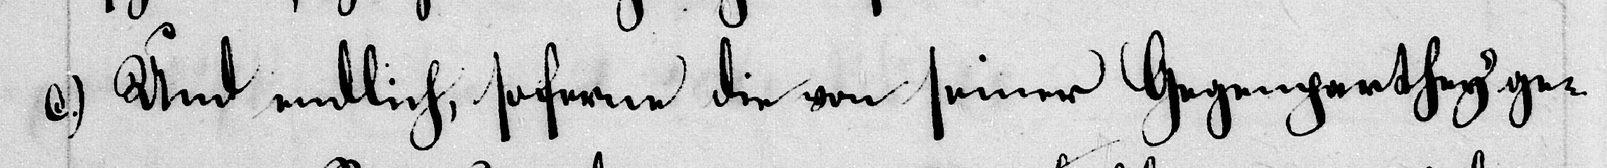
c.) Und endlich, sofern die von seiner Gegenparthey ge¬
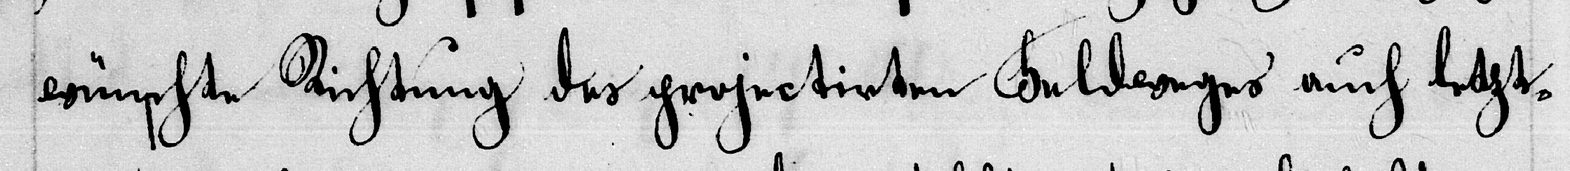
wünschte Richtung des projectirten Feldweges auch letzt¬
